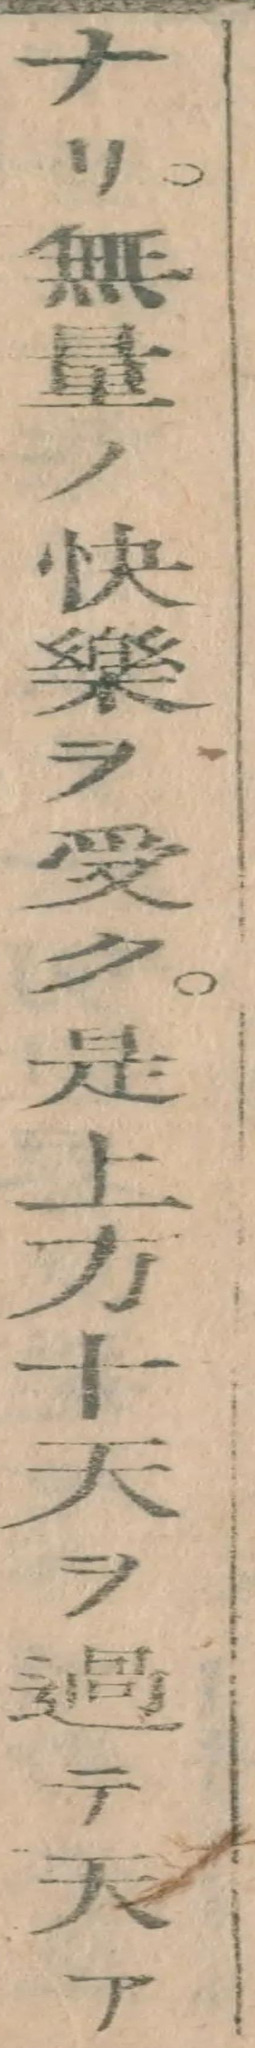ナリ。無量ノ快楽ヲ受ク。是上方十天ヲ過テ天ア
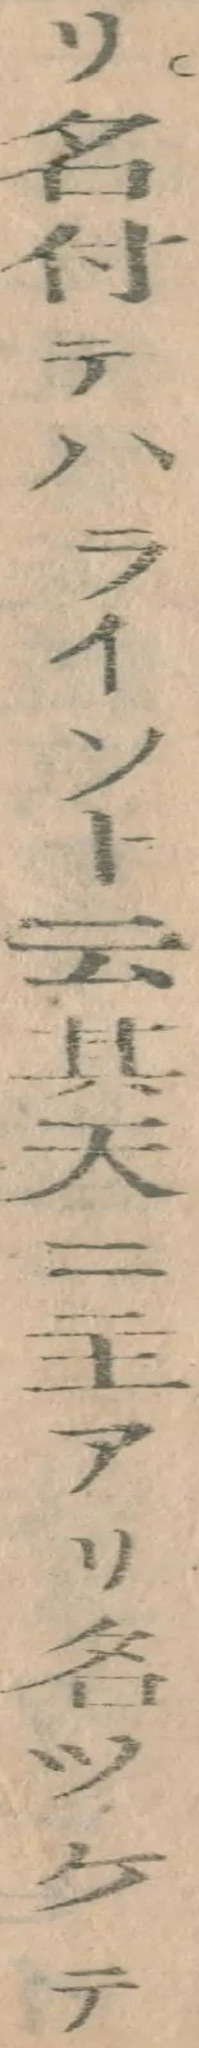リ。名付テハライソト云其天ニ主アリ。名ツケテ
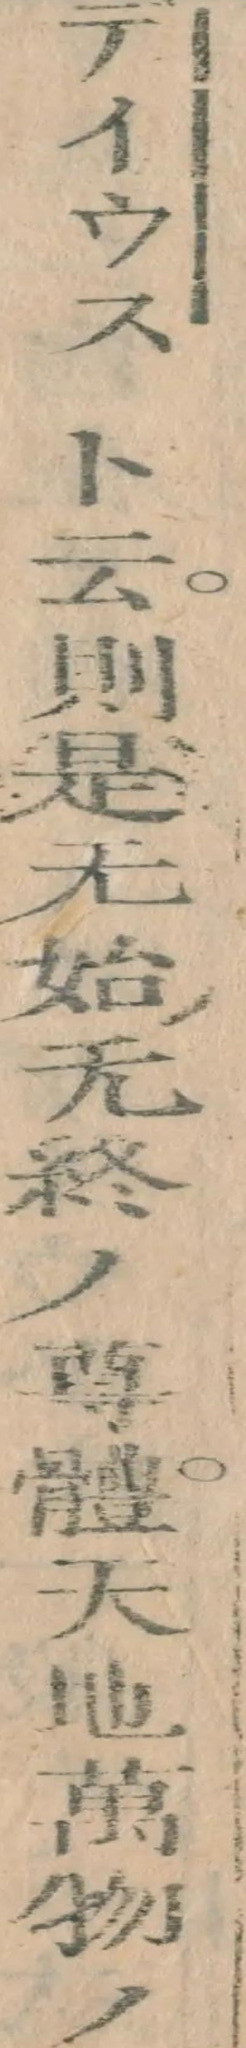デイウスト云。則是無始無終ノ尊体。天地万物ノ
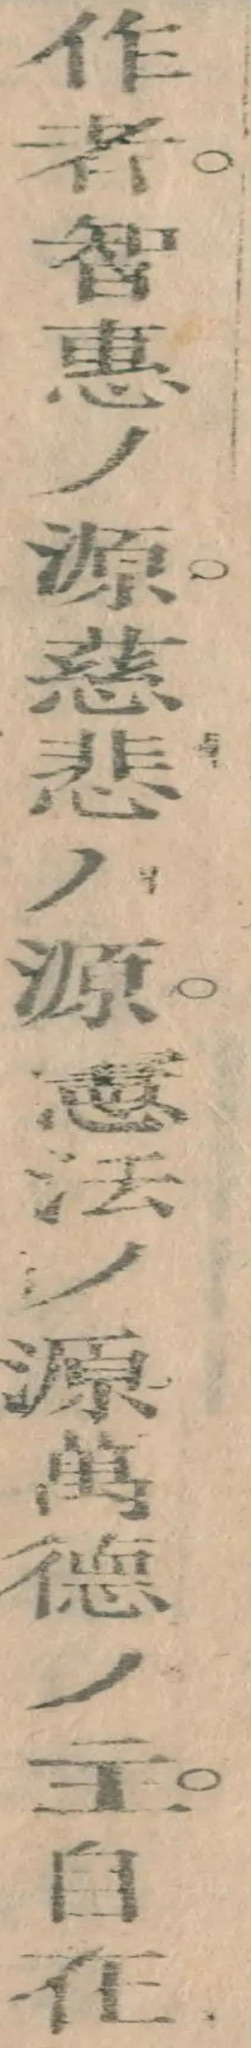作者。智恵ノ源。慈悲ノ源。憲法ノ源。万徳ノ主。自在
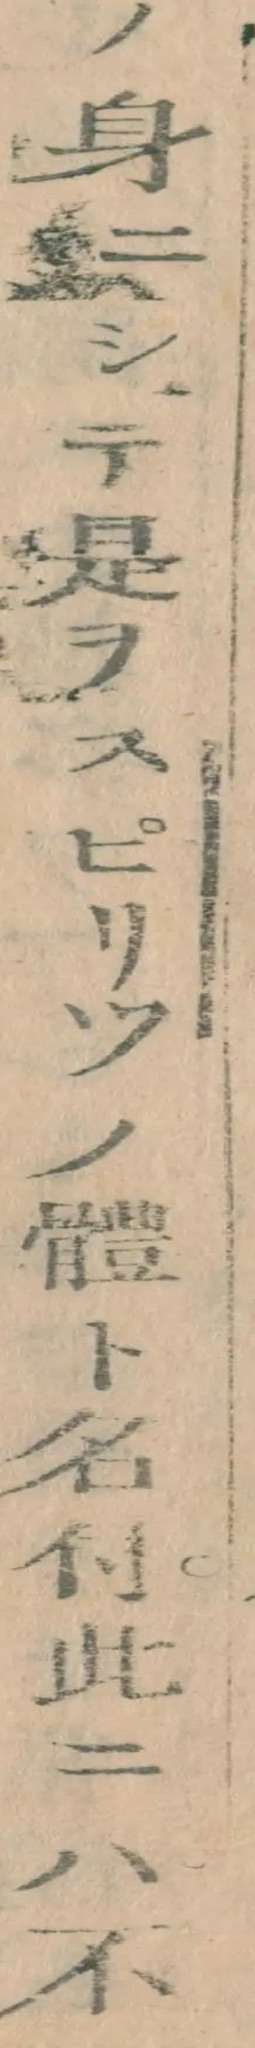ノ身ニシテ是ヲスピリツノ体ト名付。此ニハ不

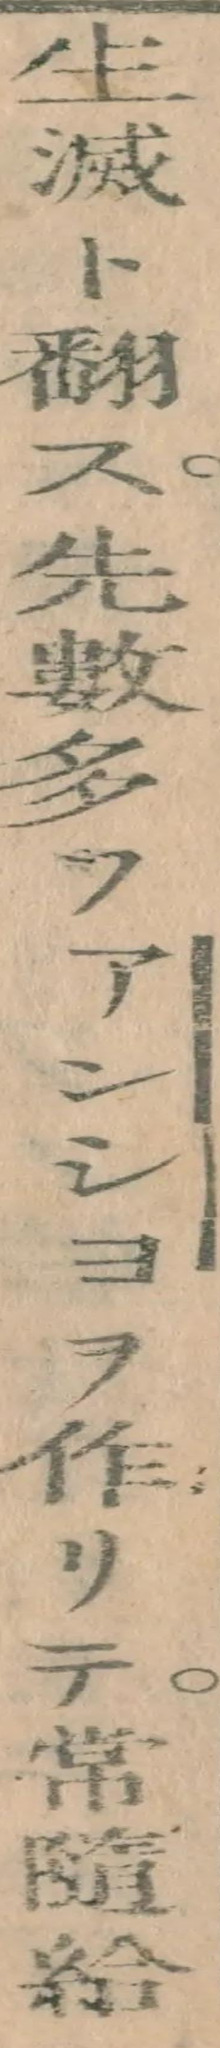生滅ト翻ス。先数多ノアンシヨヲ作リテ。常随給
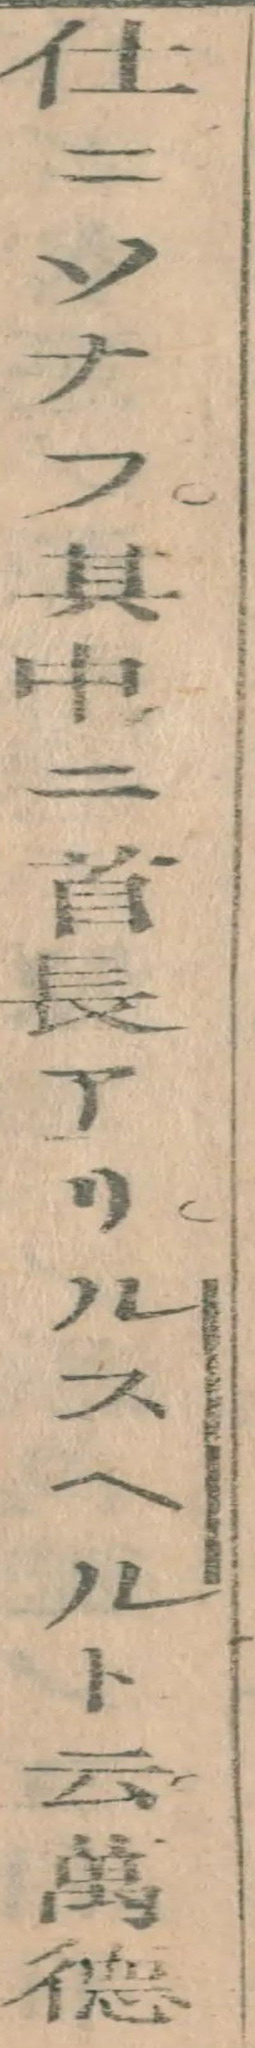仕ニソナフ。其中ニ首長アリ。ルスヘルト云。万徳
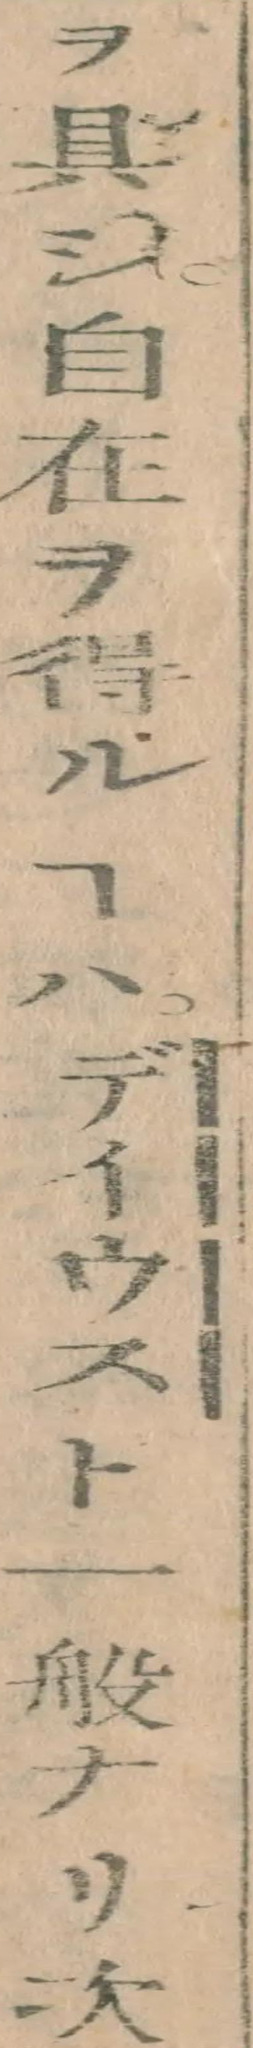ヲ具シ。自在ヲ得ルヿハ。デイウスト一般ナリ。次
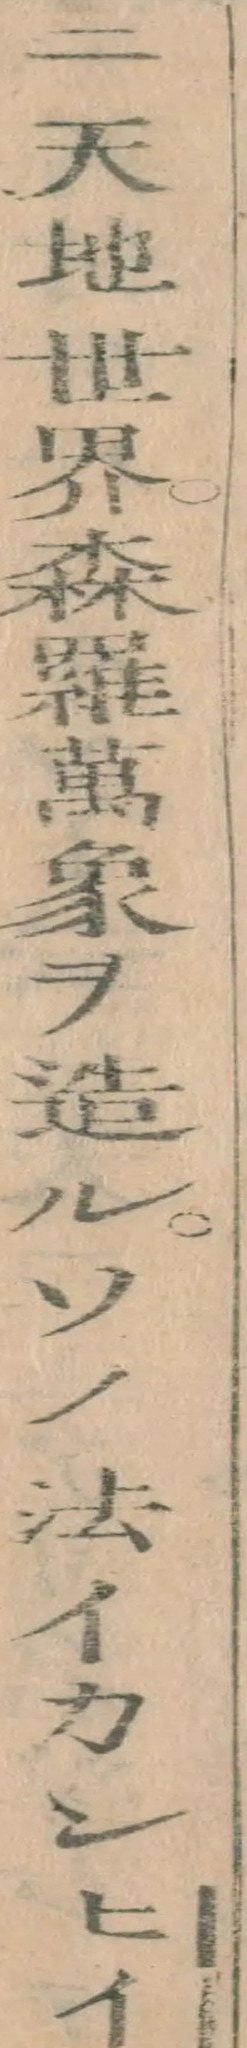ニ天地世界。森羅万象ヲ造ル。ソノ法イカンヒイ
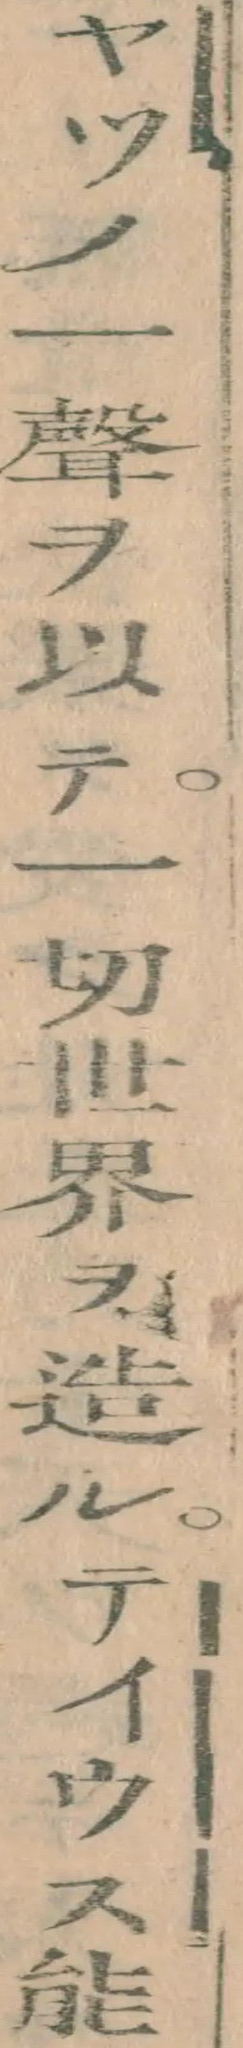ヤツノ一声ヲ以テ。一切世界ヲ造ル。テイウス能
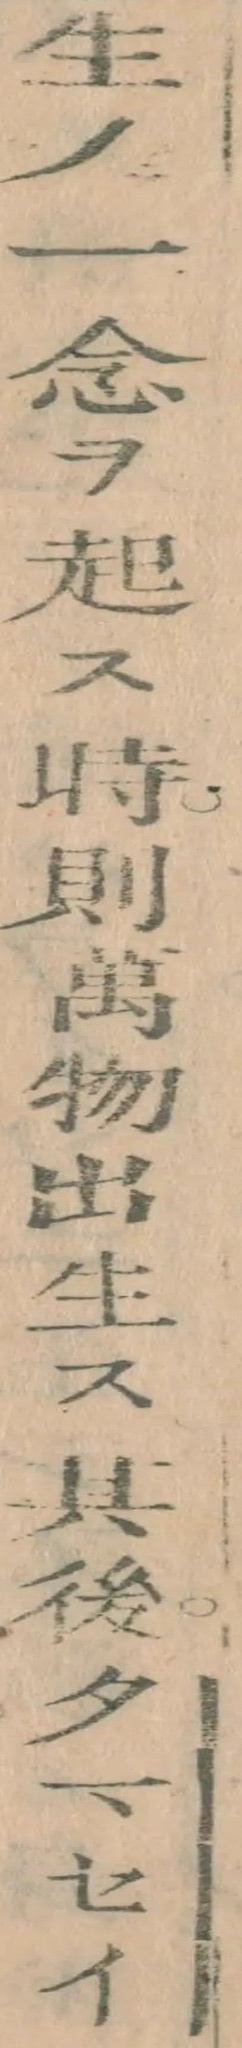生ノ一念ヲ起ス時。則万物出生ス其後。タマセイ
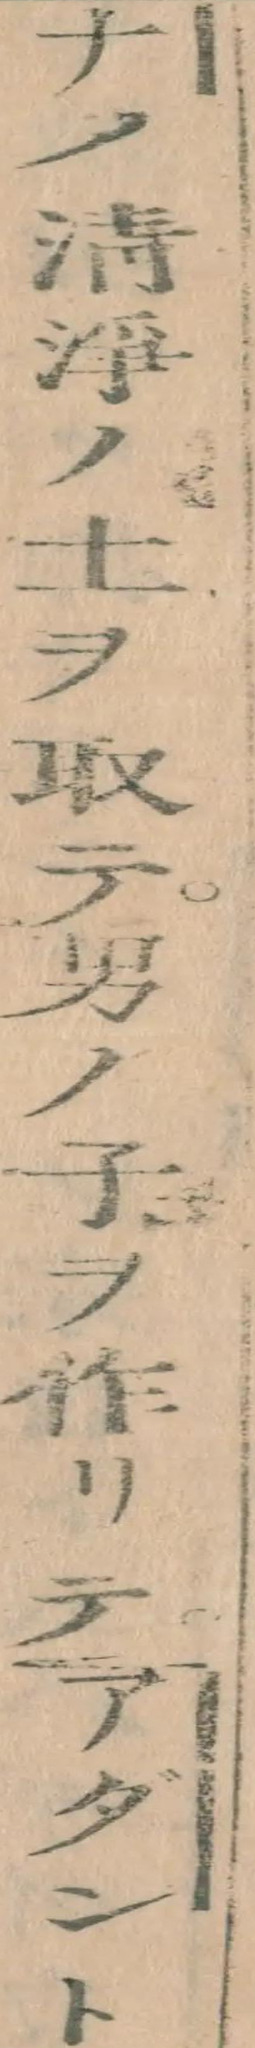ナノ清浄ノ土ヲ取テ。男ノ子ヲ作リテ。アダント
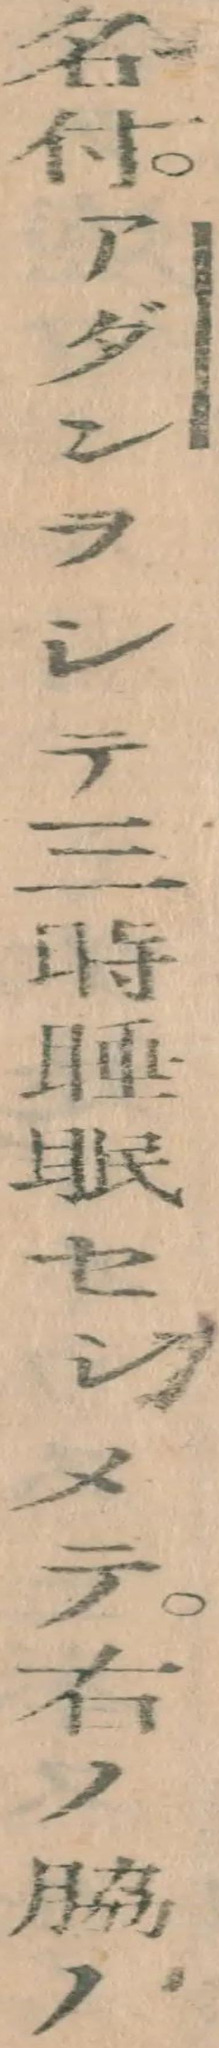名付。アダンヲシテ三時睡眠セシメテ。右ノ脇ノ
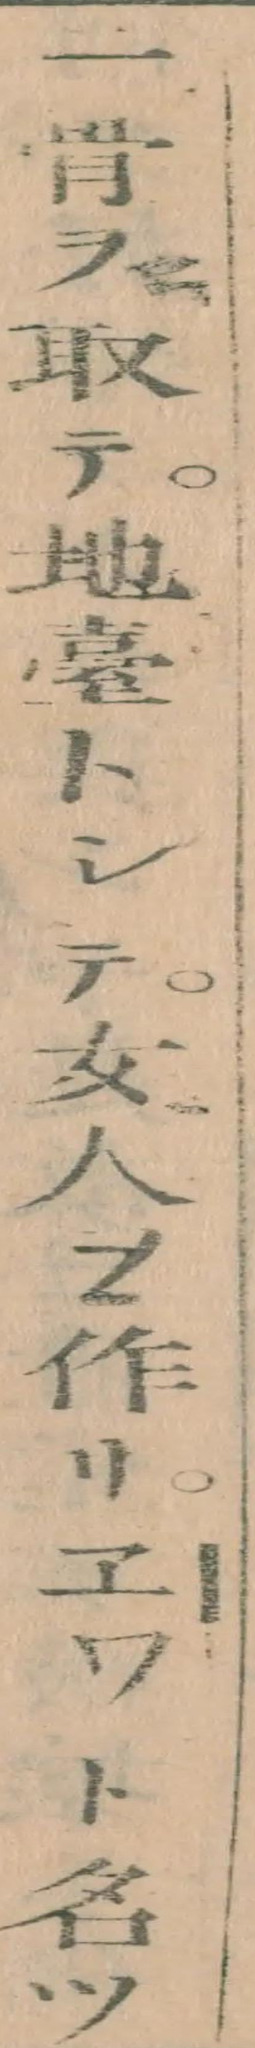一骨ヲ取テ。地台トシテ。女人ヲ作リ。エワト名ツ
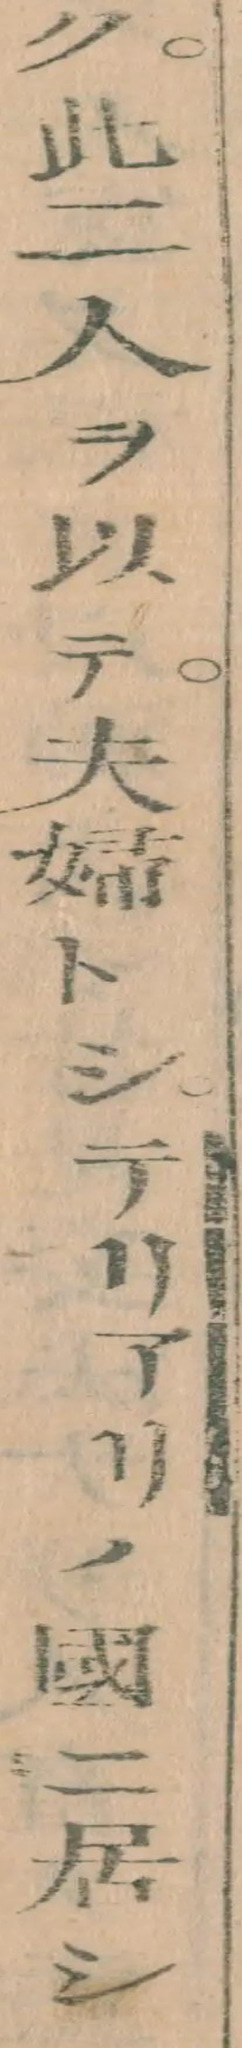ク。此二人ヲ以テ。夫婦トシ。テリアリノ国ニ居シ
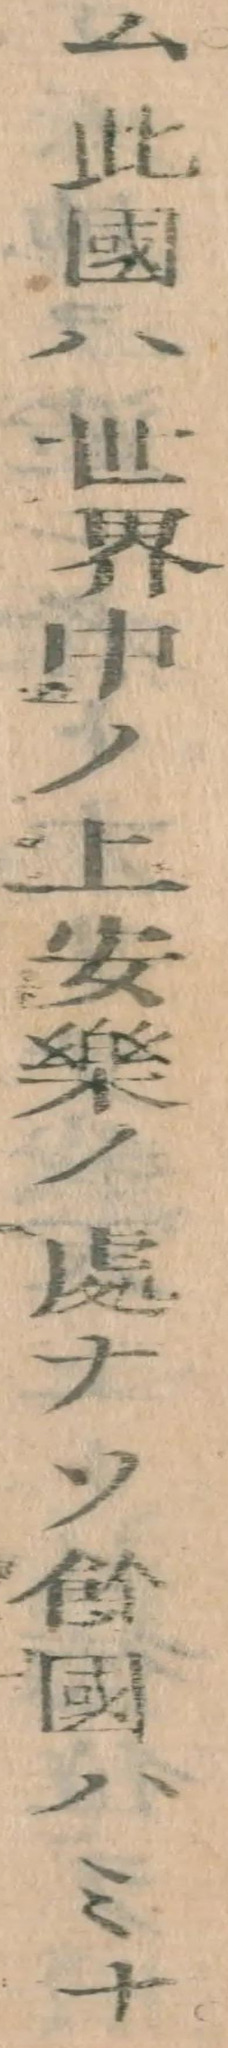ム。此国ハ世界中ノ上安楽ノ処ナソ余国ハミナ。
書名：南蛮寺興廃記
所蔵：国立国会図書館 National Diet Library, JAPAN
